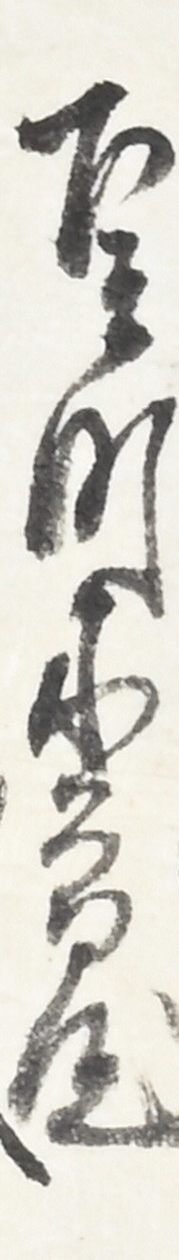下モ町木曽屋
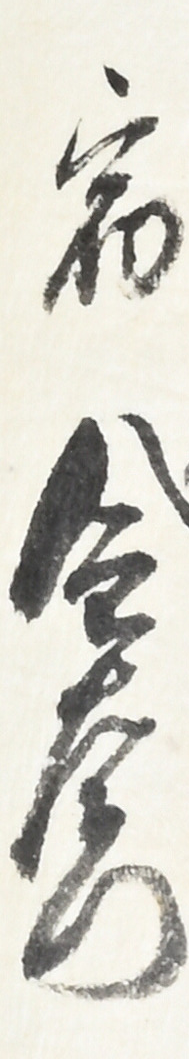宿金右衛門

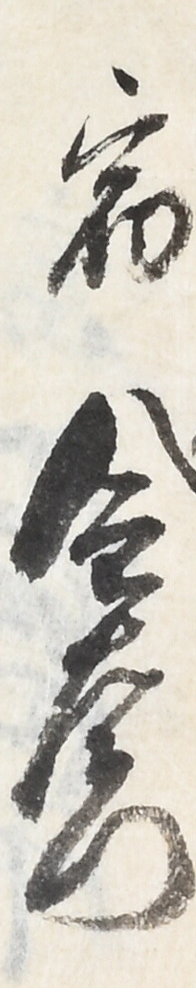宿助右衛門
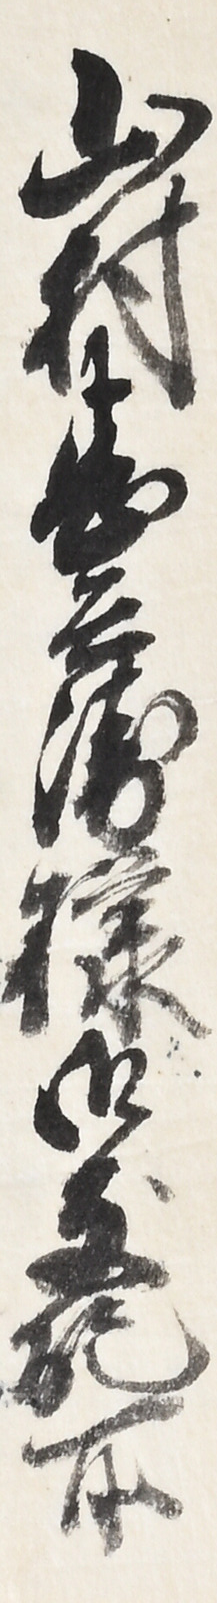山村甚兵衛様御支配所
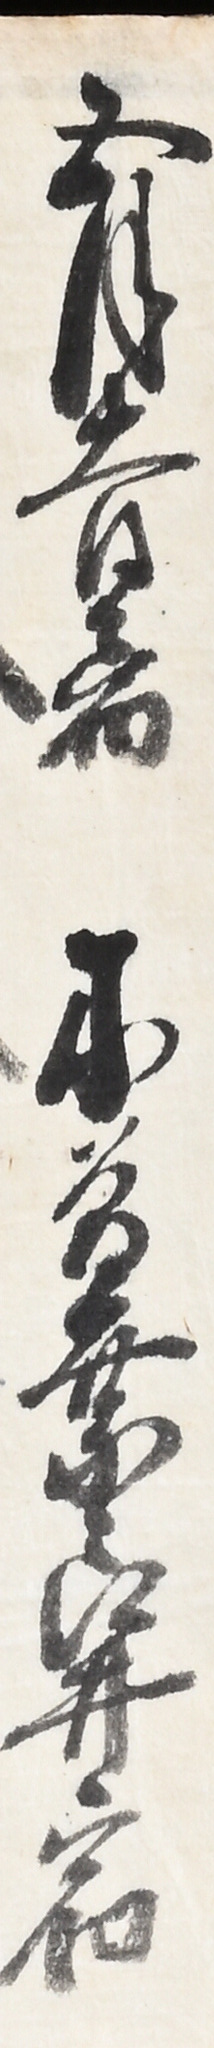五月十一日着木曽奈良井宿
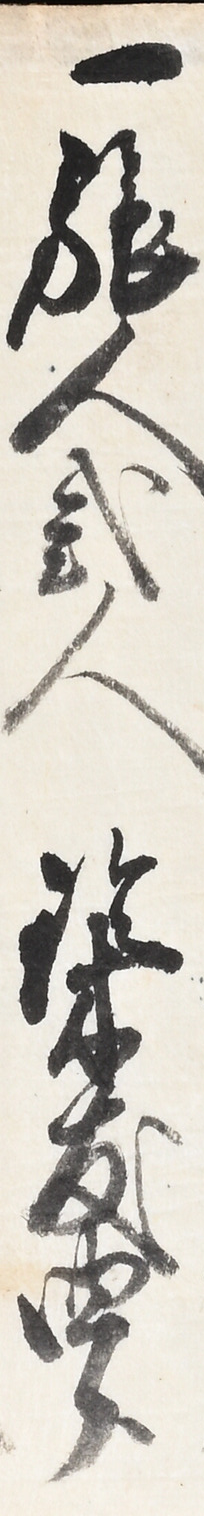一旅人弐人鈴木友四郎
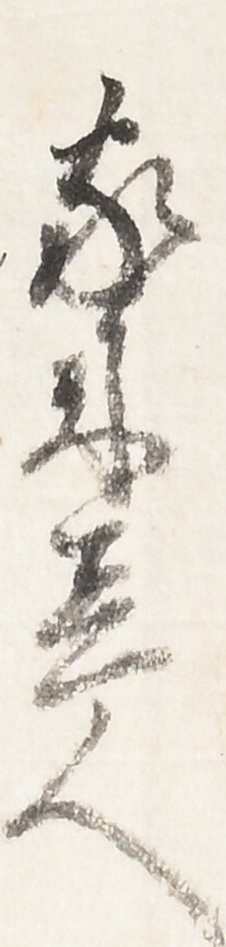家来壱人
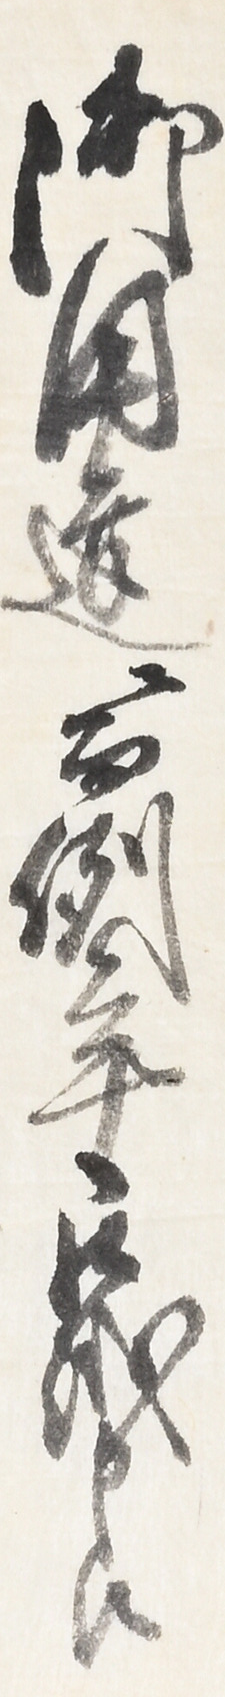御用達ニ而例年罷越申候
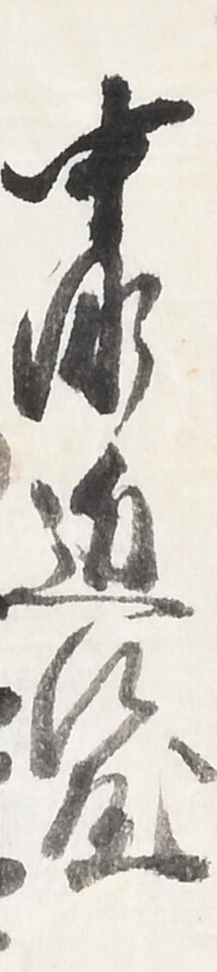中町近江屋
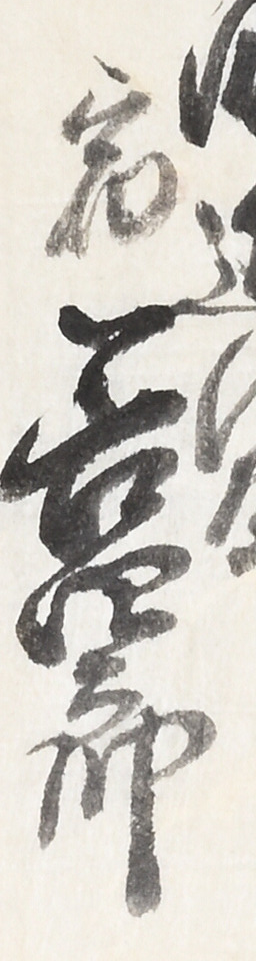宿善四郎
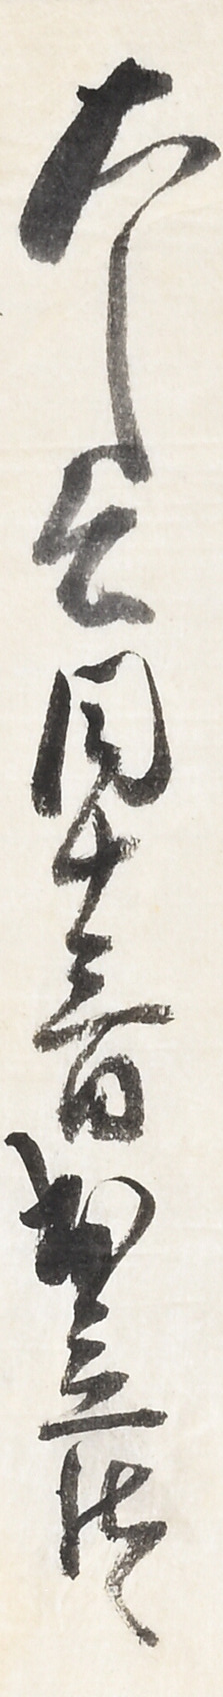右之者同十三日出立仕候
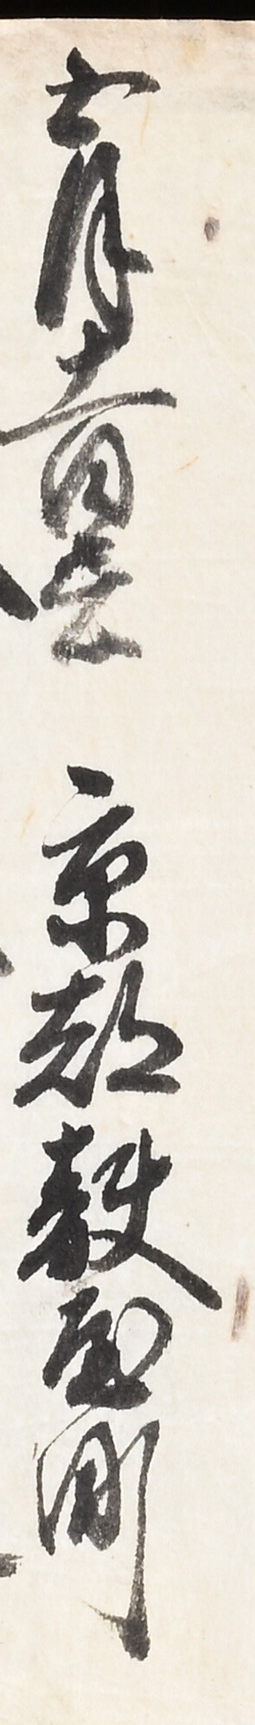五月十一日着京都麩屋町
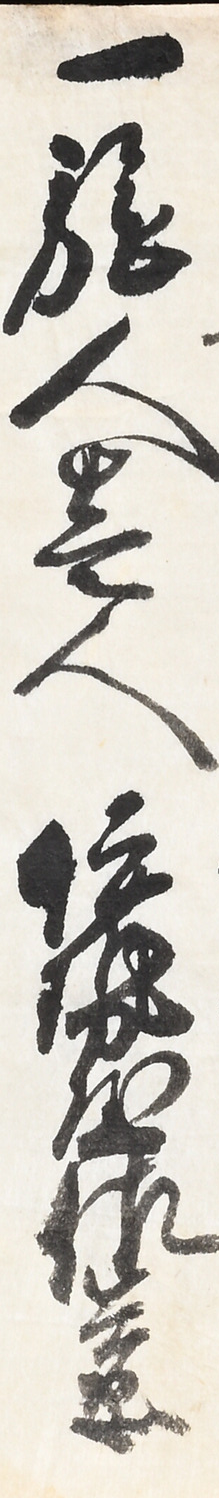一旅人壱人伊勢屋佐兵衛
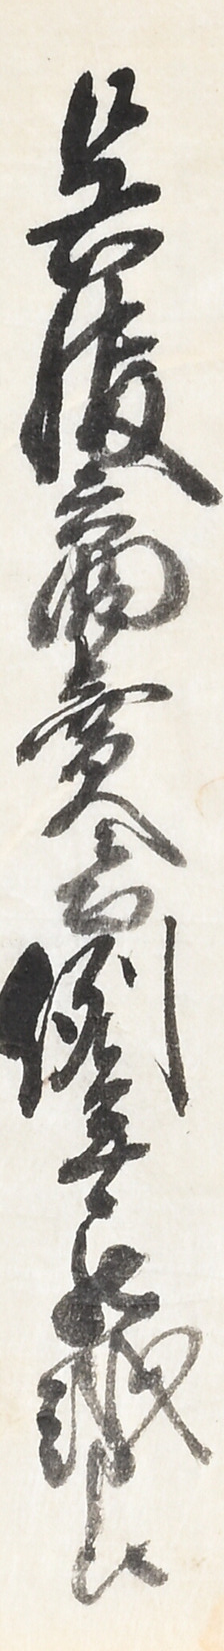呉服商売ニ而例年罷越申候
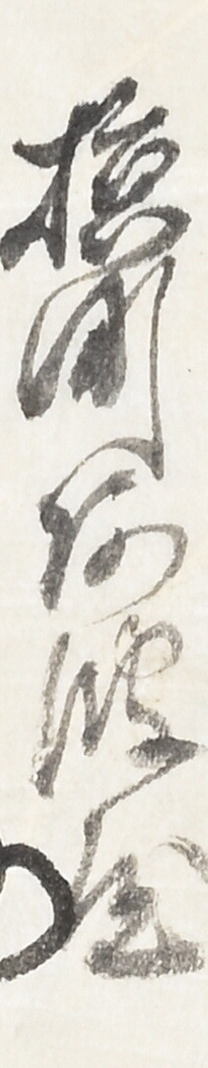横町阿波屋
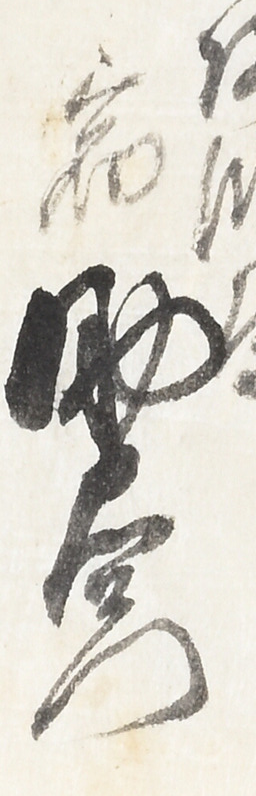宿助右衛門
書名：旅人泊控帳
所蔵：伊那市立高遠町図書館・合同会社AMANE
